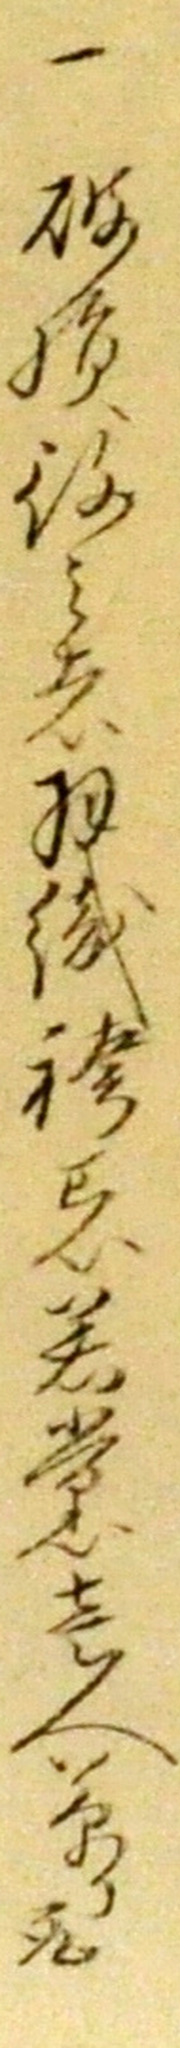一破損役之者羽織袴着若党壱人草り取
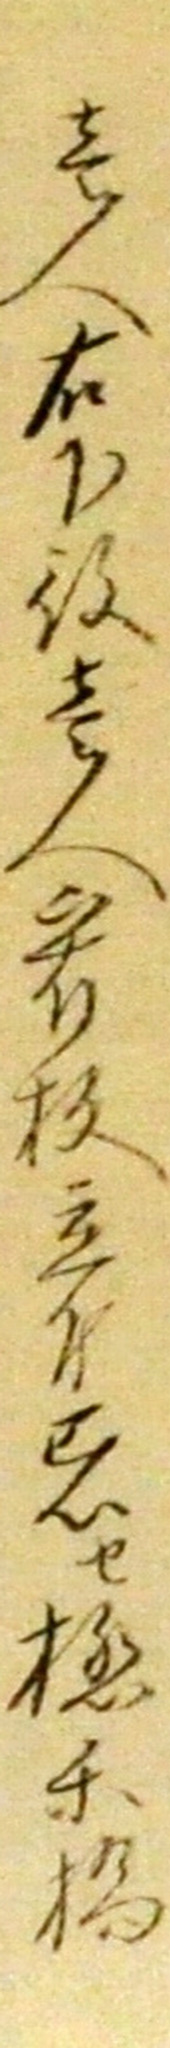壱人右下役壱人看板立付着せ極楽橋
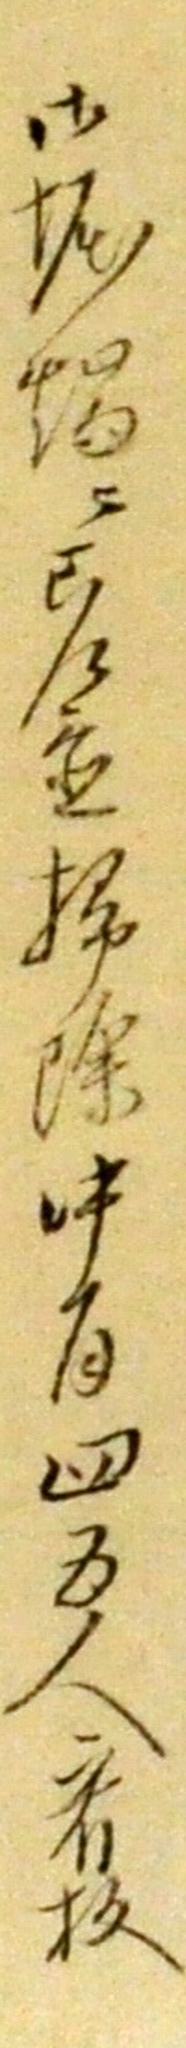御堀端に差置掃除中間四五人看板
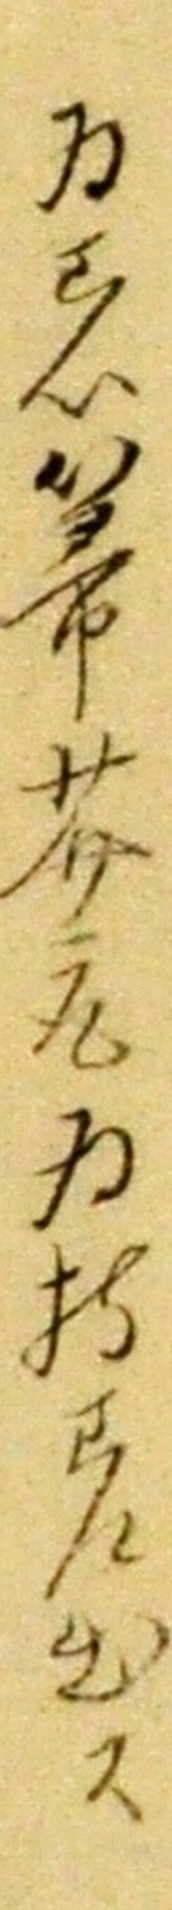為着箒芥取為持差出ス
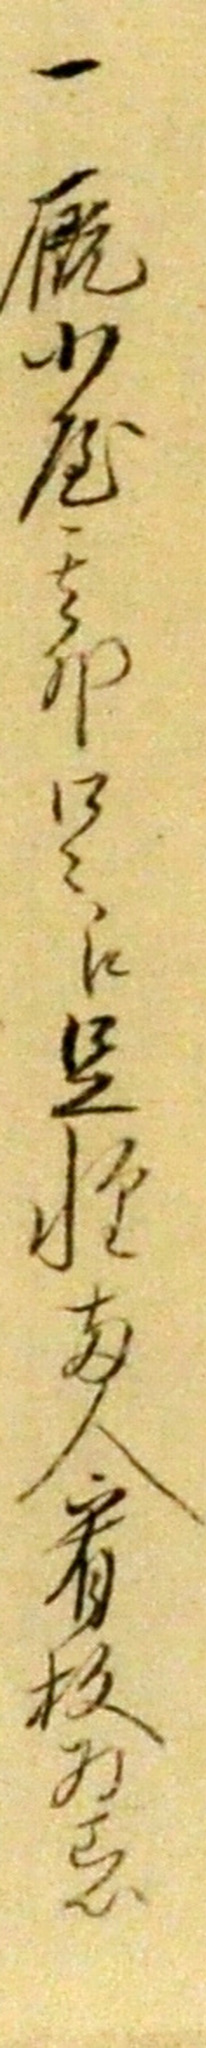一厩小屋其外口々え足軽両人看板為着
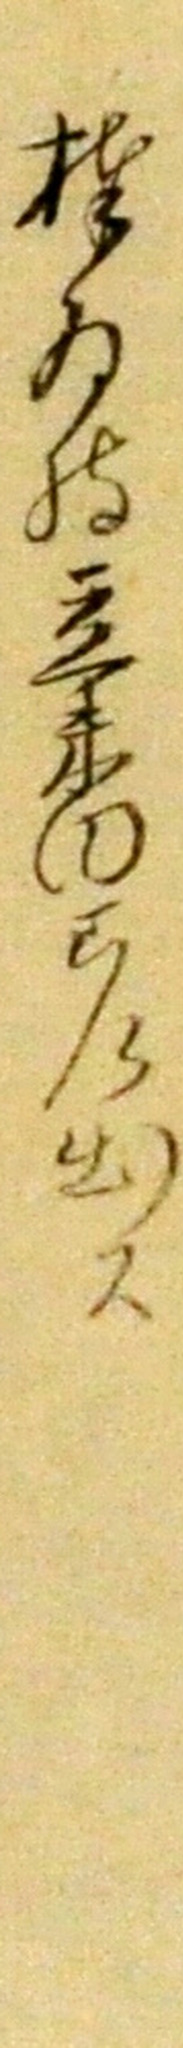棒為持立番差出ス
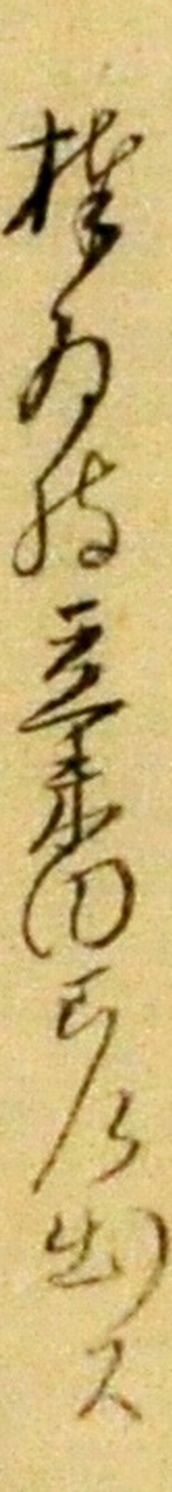棒為持立番差出ス
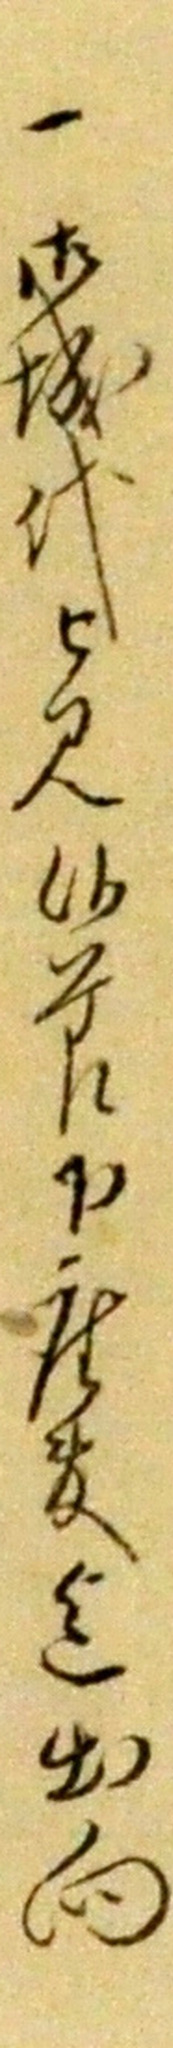一御城代被見候節下座敷迄出向
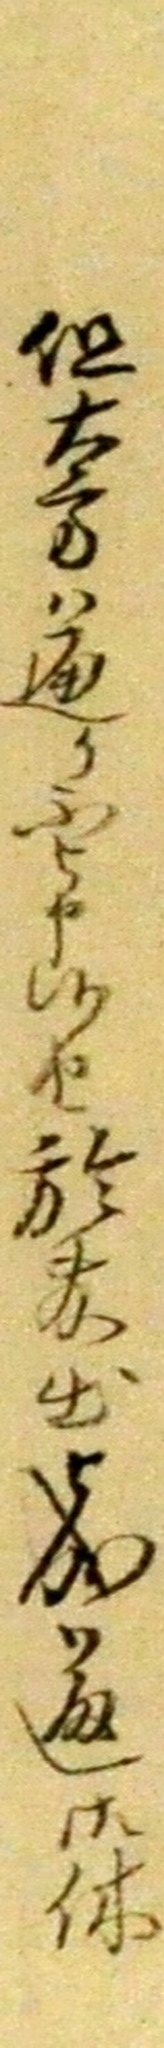但大方は通り不被申候由於敷出被成御通御休
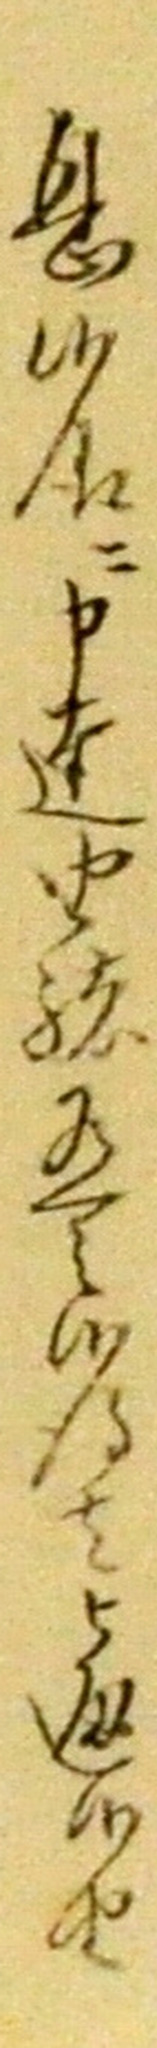息候様に申達由緒有之候得は被通候由
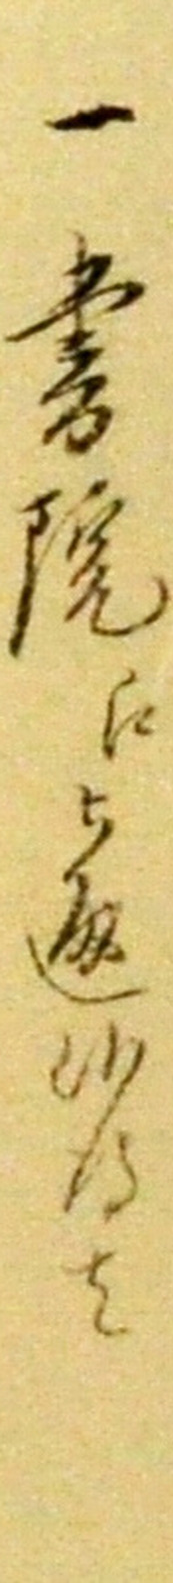一書院え被通候得は
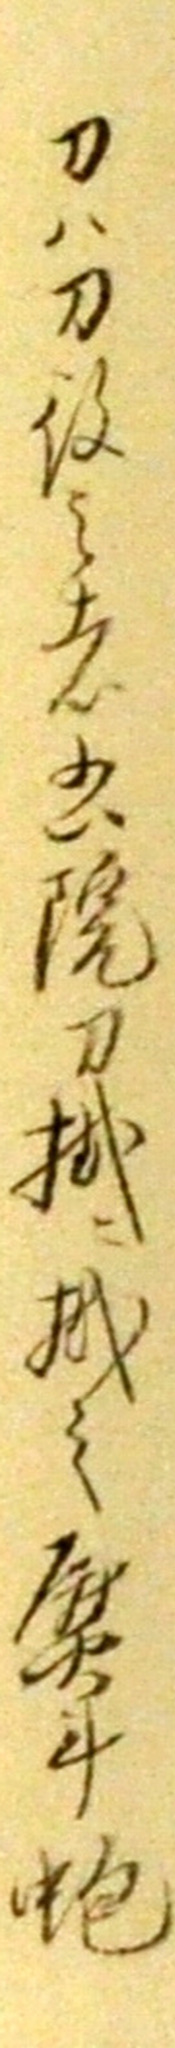刀は刀役之者書院刀掛に掛之熨斗蚫

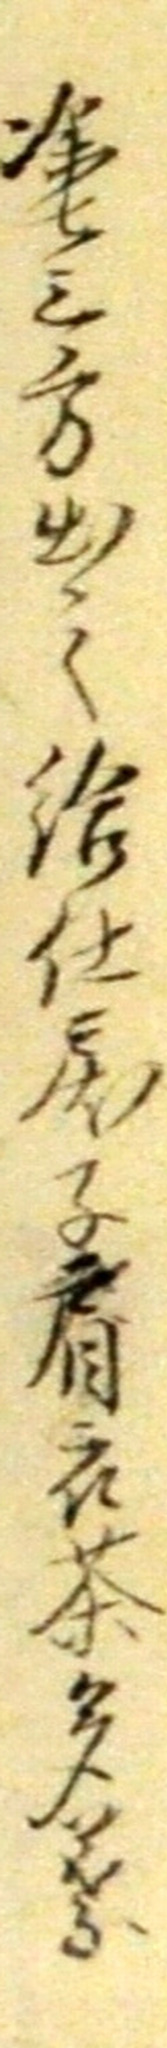塗三方出之給仕戻子肩衣茶多葉
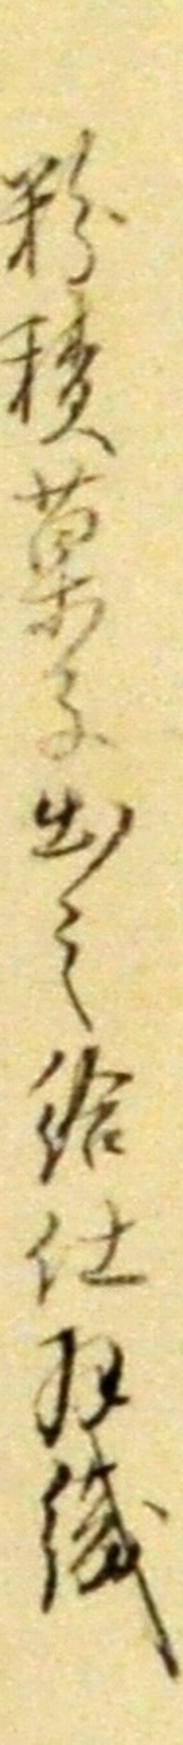粉積菓子出之給仕羽織
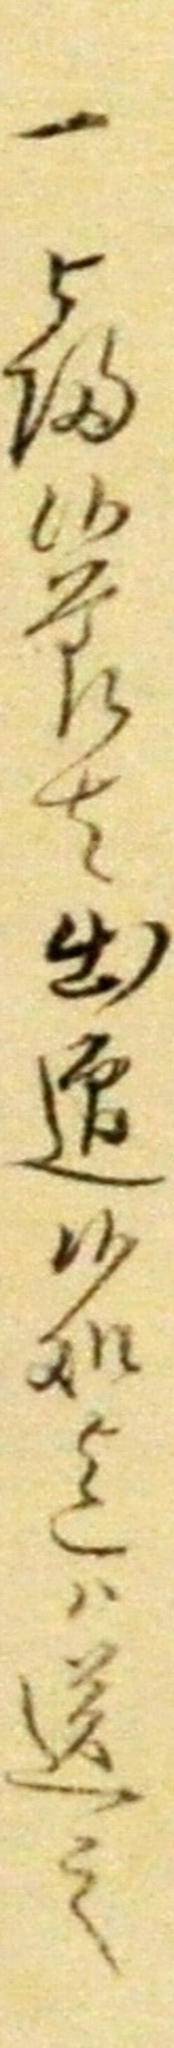一被帰候節は出迎候処迄は送之
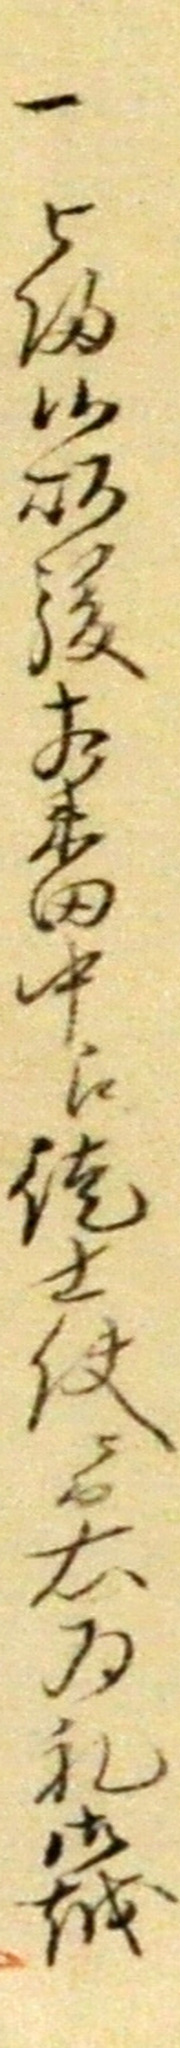一被帰候以後相番中え徒士使に而右為礼御越
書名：大阪加番関係諸書留〔一括〕
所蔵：伊那市立高遠町図書館・合同会社AMANE
